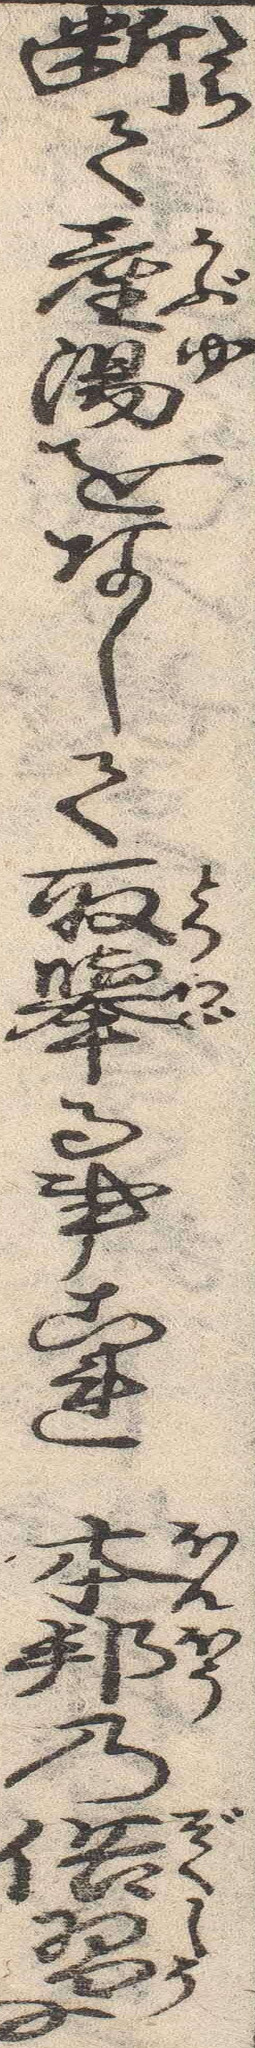断て産湯をなして取擧る事これ本邦の俗習な
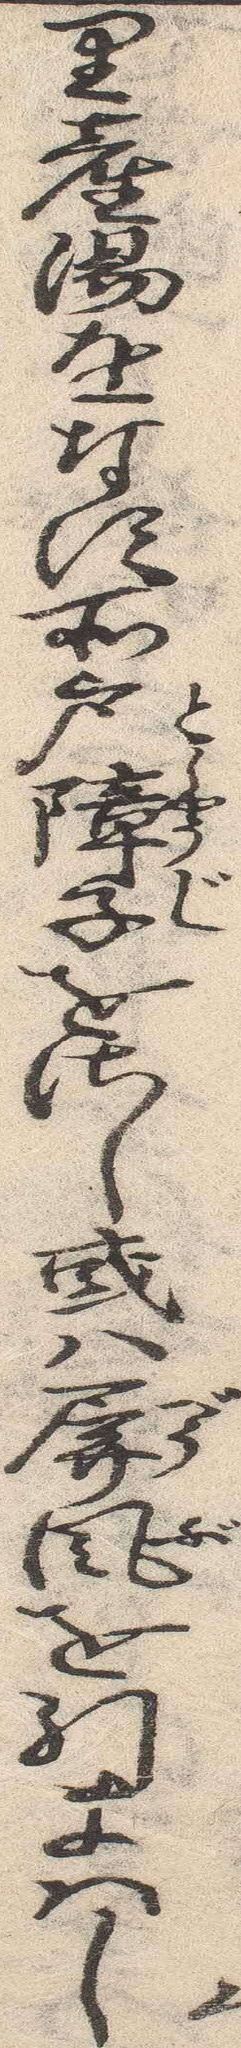り産湯をなす所戸障子をさし或は屏風を引まはし
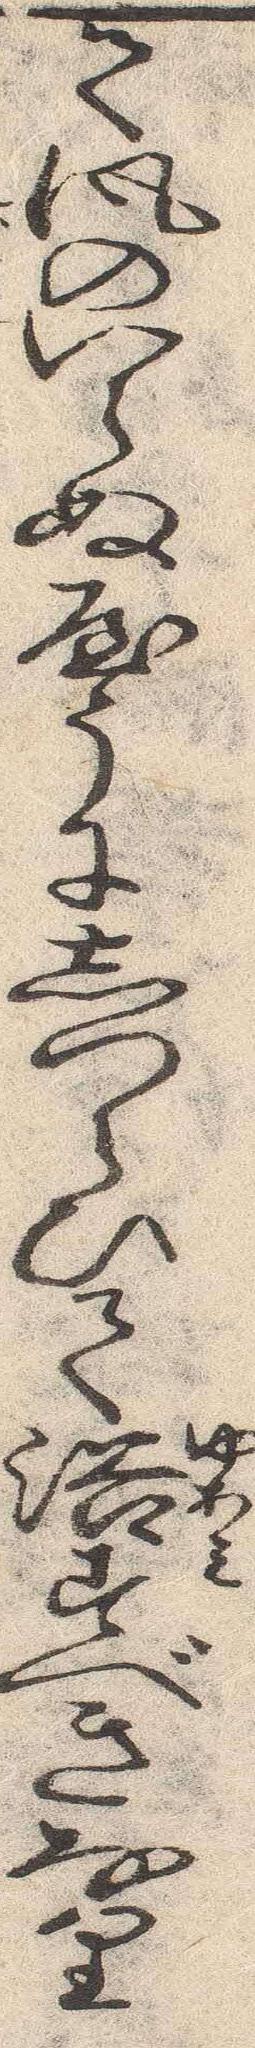て風のいらぬやうにしつらひて浴すべきなり
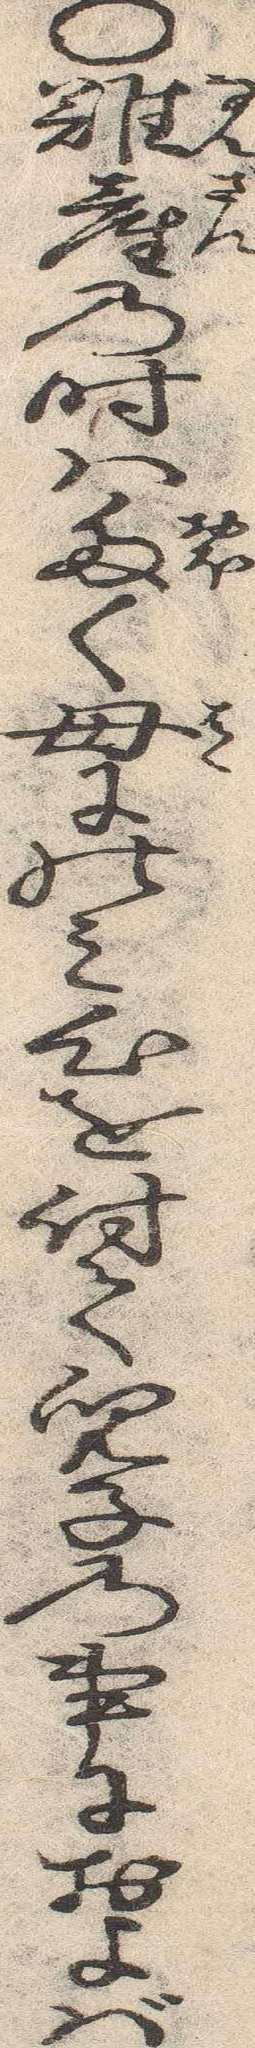◯難産の時は多く母にのみ心を付て児子の事におよば
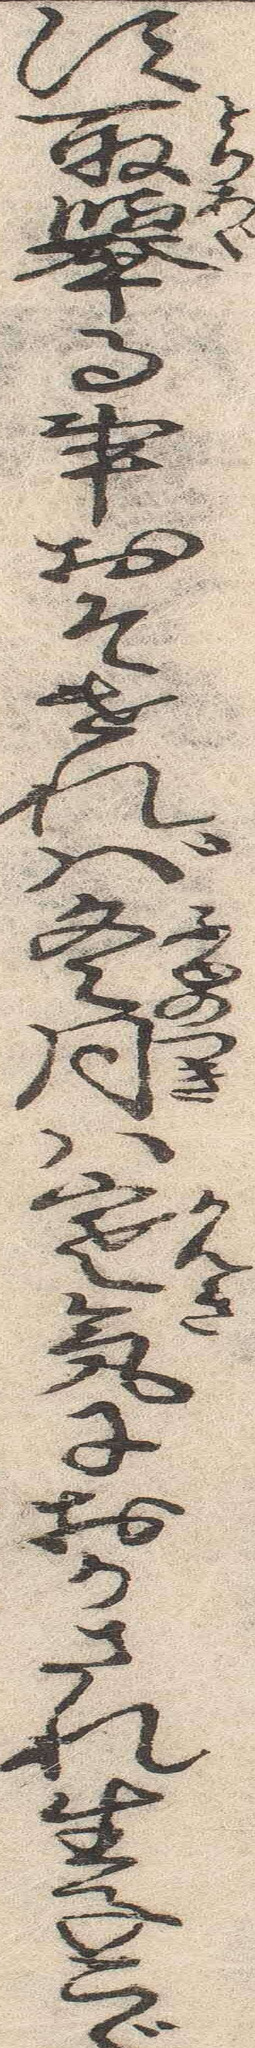す取擧る事おそければ冬月は寒気におかされ生子こゞ
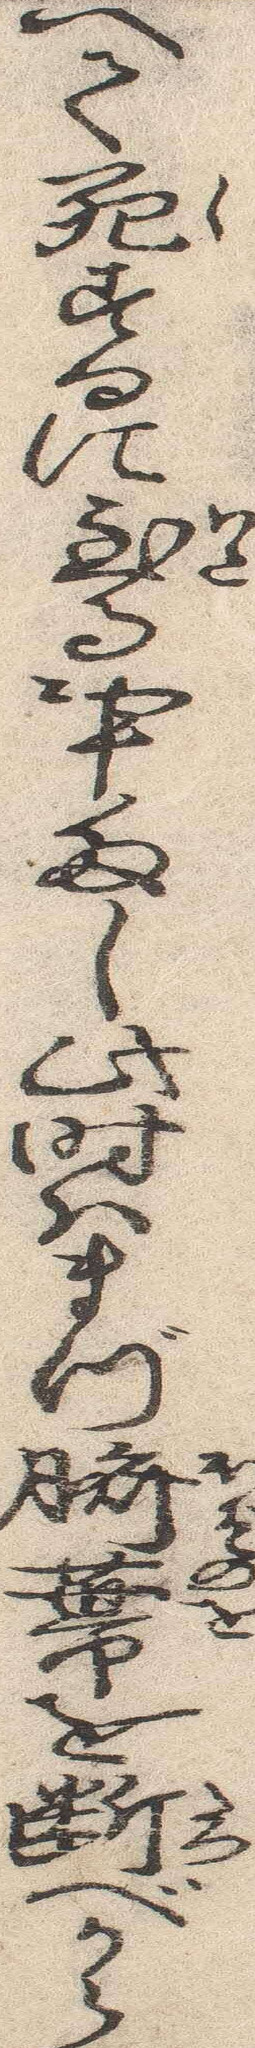へて死するに至る事多し此時はまづ臍蔕を断べから
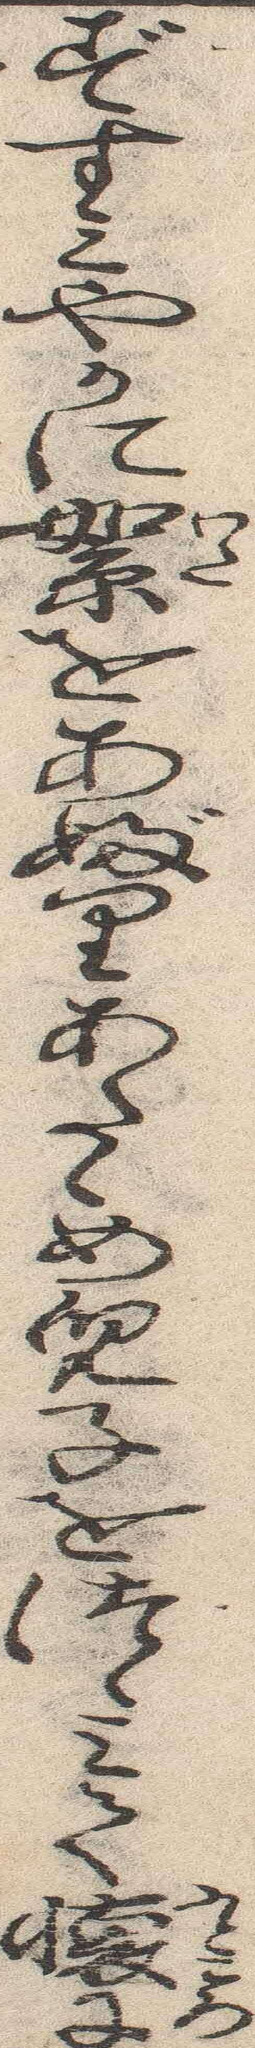ずすみやかに絮をあぶりあたゝめ児子をつゝみて懐に
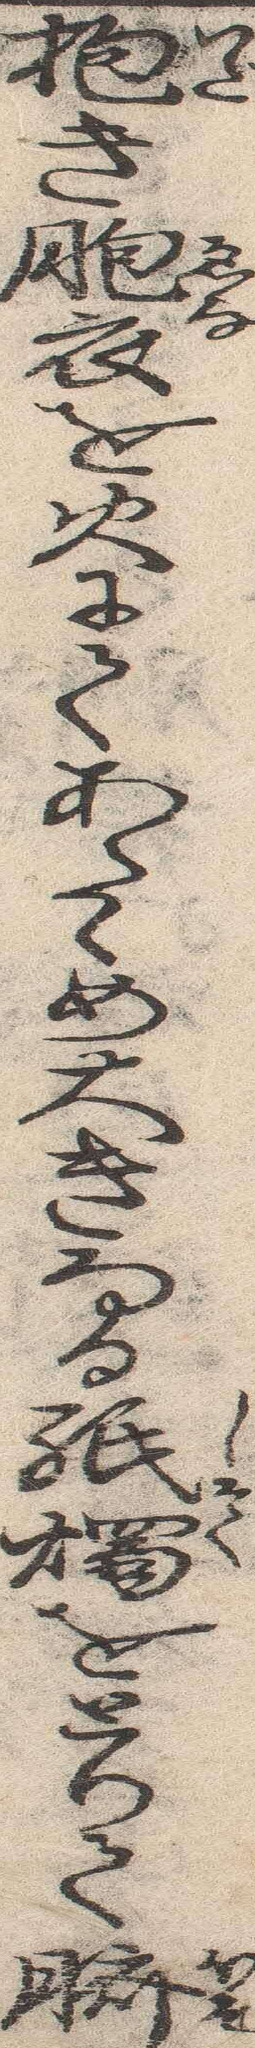抱き胞衣を火にてあたゝめ大きなる紙燭をとりて臍
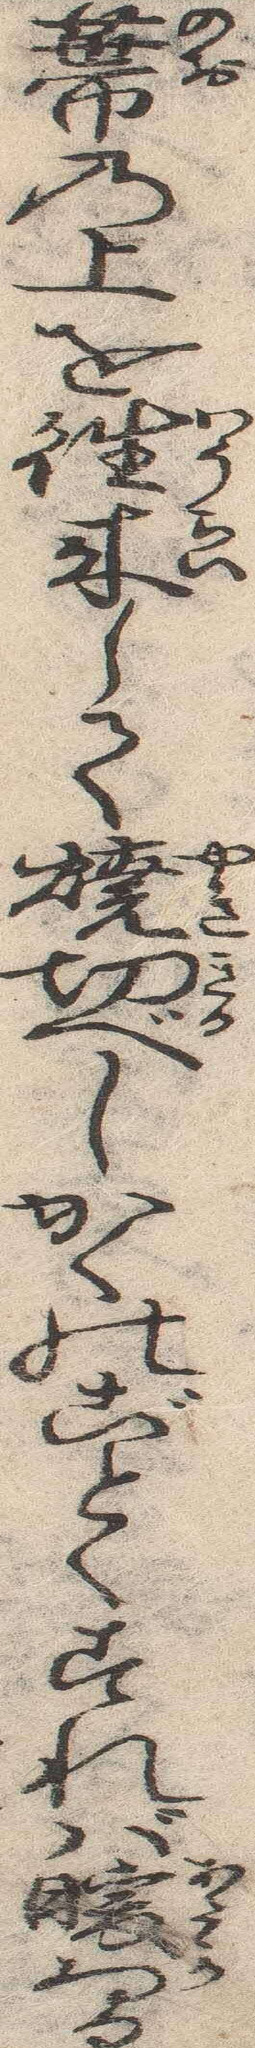蔕の上を往來して焼切べしかくのごとくすれば暖なる
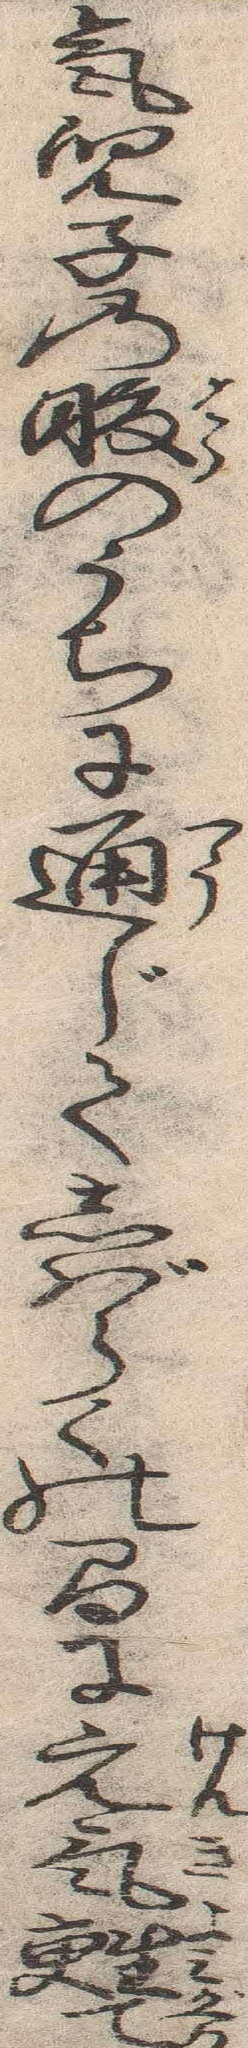気児子の腹のうちに通じてしばらくの間に元気甦て
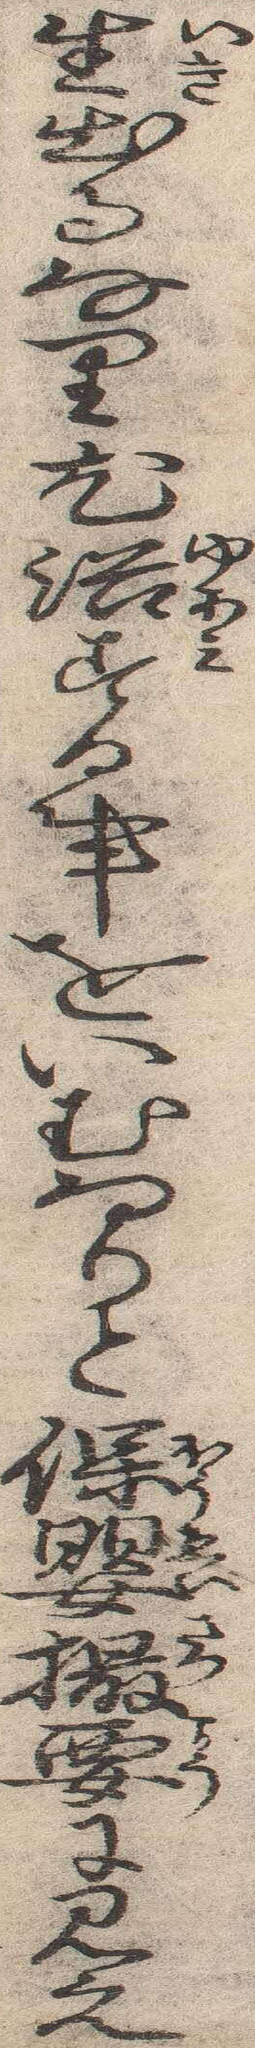生出るなり尤浴する事をいむなりと保嬰撮要に見え

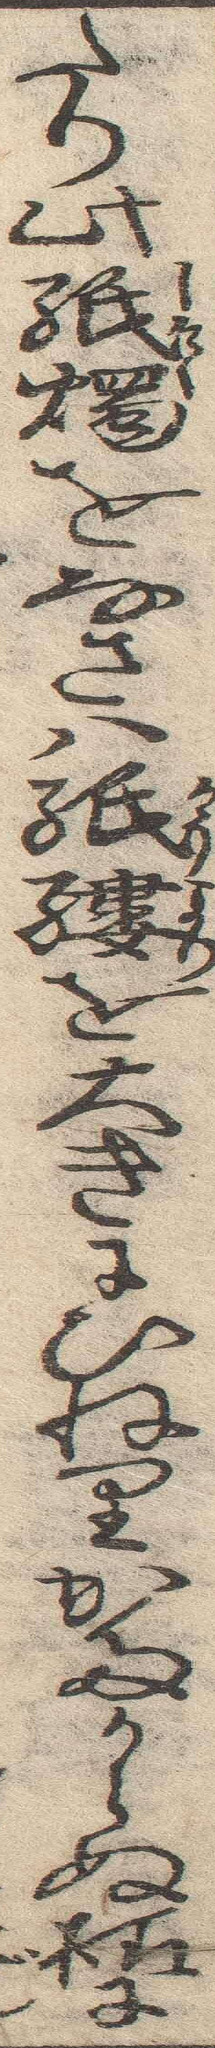たり此紙燭をなさは紙縷を大きにひねりかたからぬ様に
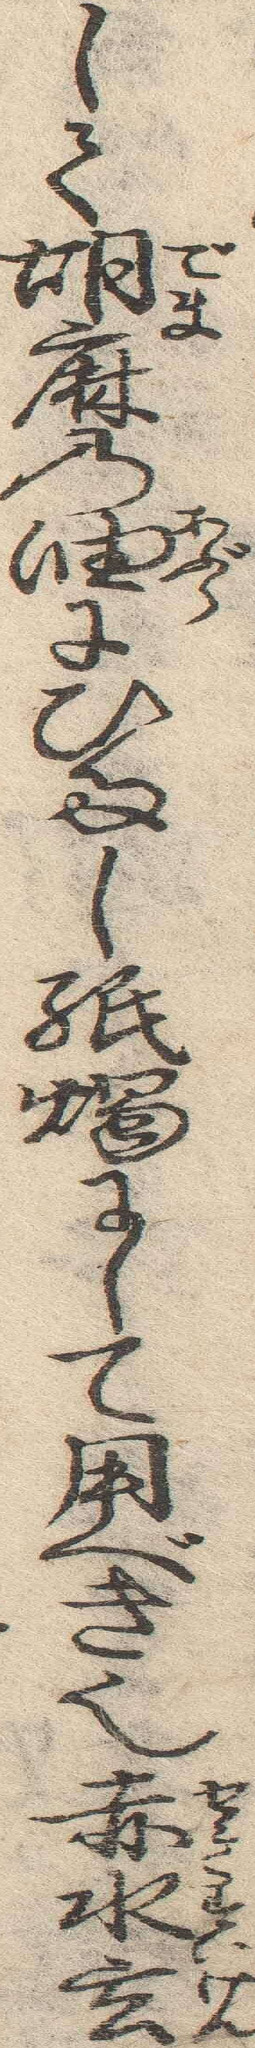して胡麻の油にひたし紙燭にして用べき也赤水玄
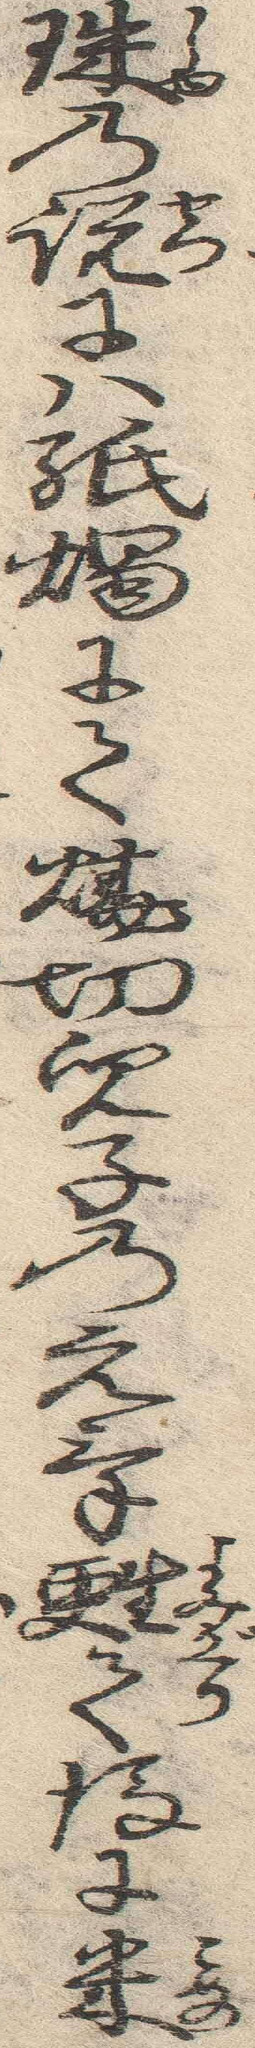珠の説には紙燭にて焼切児子の元気甦て後に米
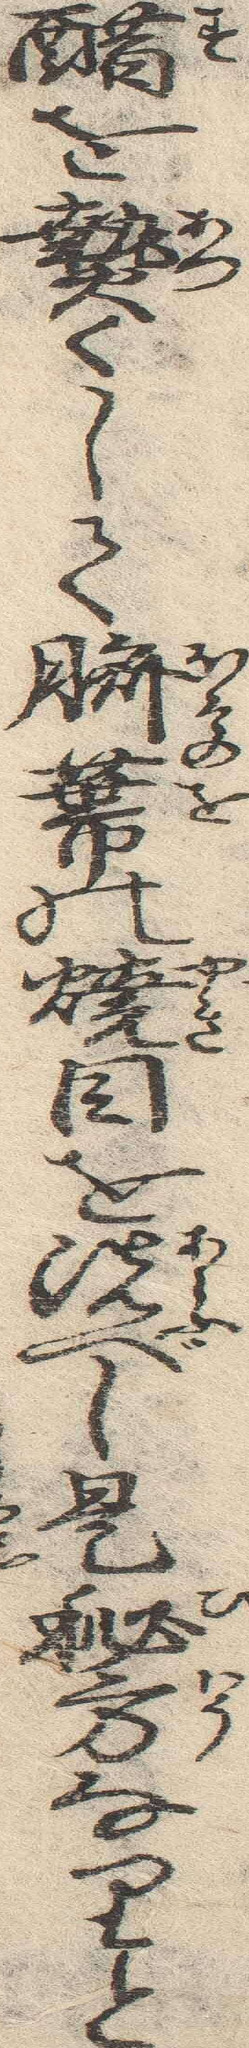醋を熱くして臍蔕の焼目を洗べし是秘方なりと
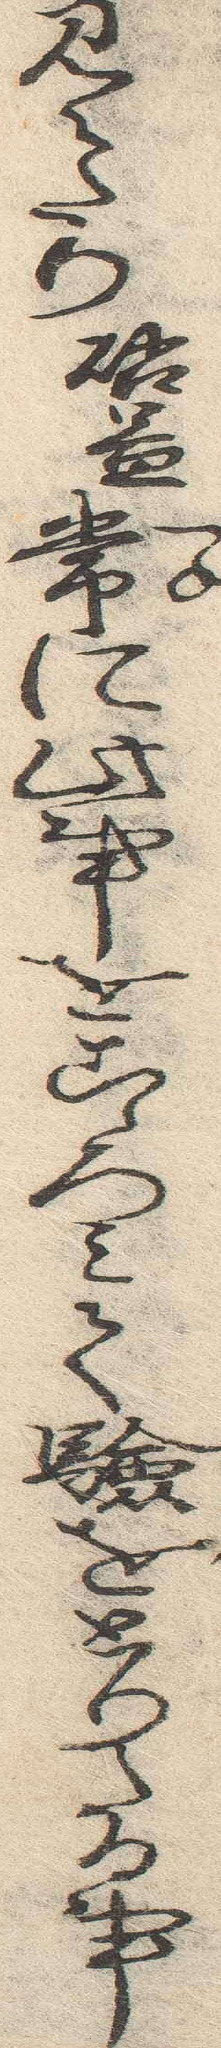見えたり啓益常に此事をこゝろみて驗をとりたる事
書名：小児必用養育草
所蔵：東京学芸大学附属図書館 国文学研究資料館
